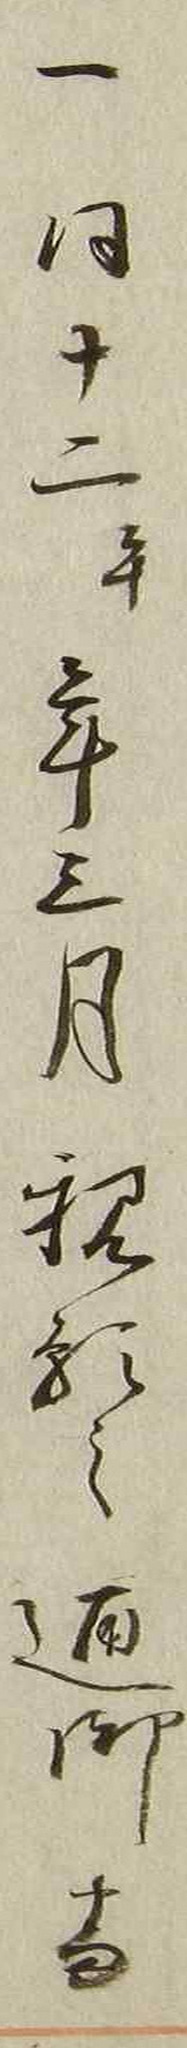一同十二午年三月親願之通御番
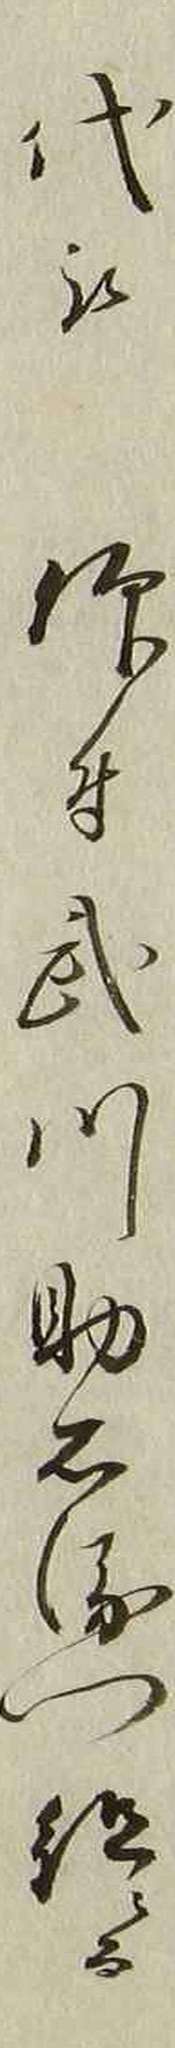代被仰付武川助右衛門組ニ而
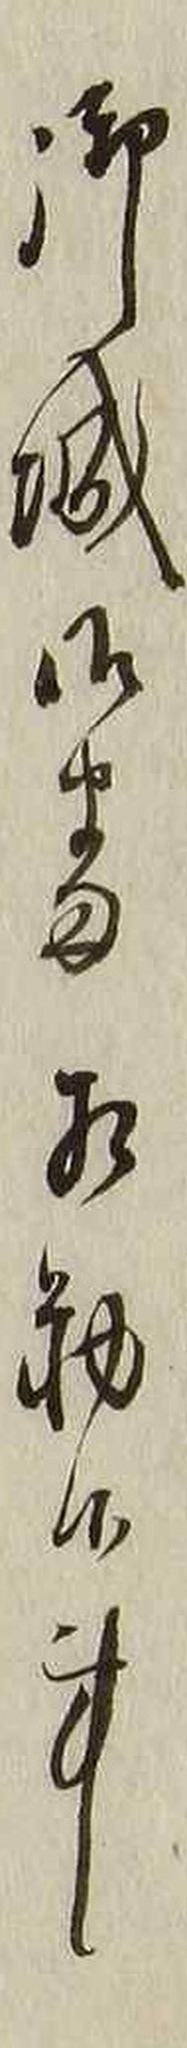御城御番相勤候事
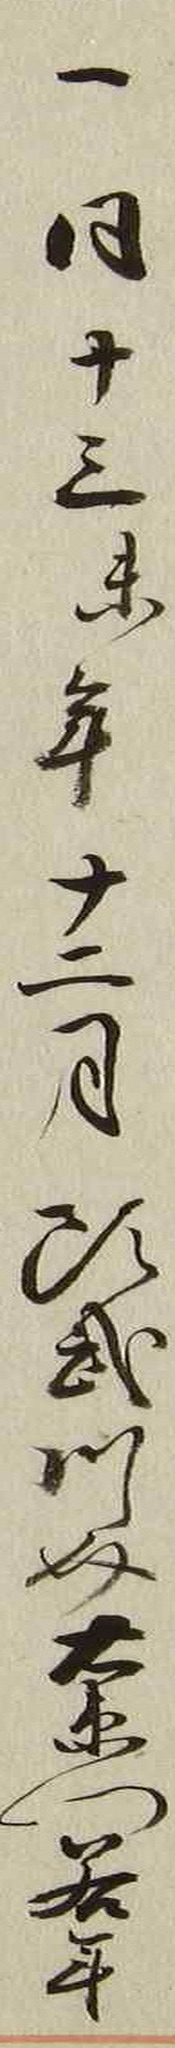一同十三未年十二月頭武川介右衛門若年
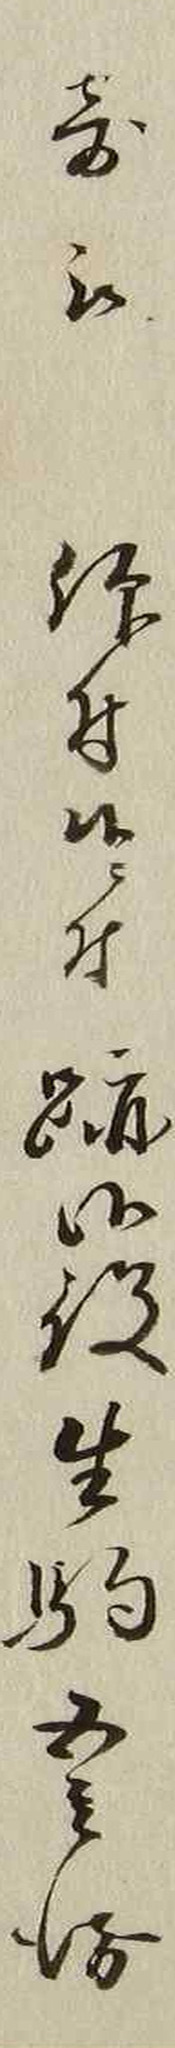寄被仰付候ニ付跡御役生駒五兵衛
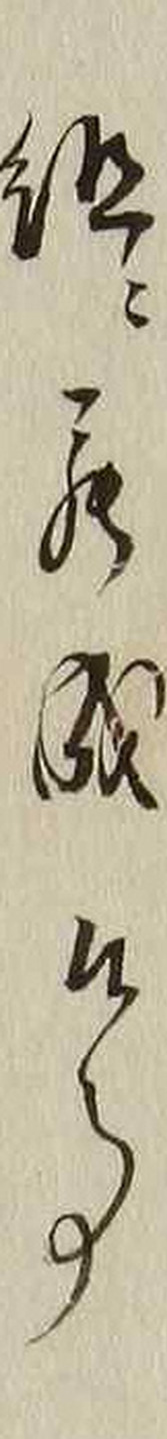組ニ罷成候事
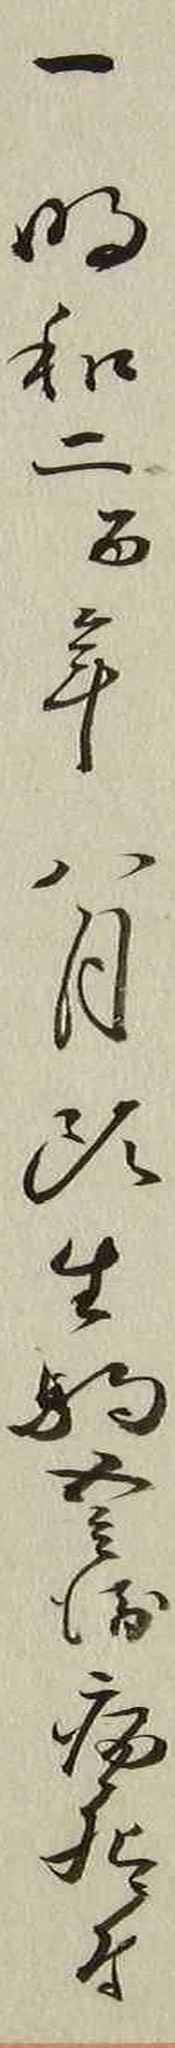一明和二酉年八月頭生駒五兵衛病死ニ付
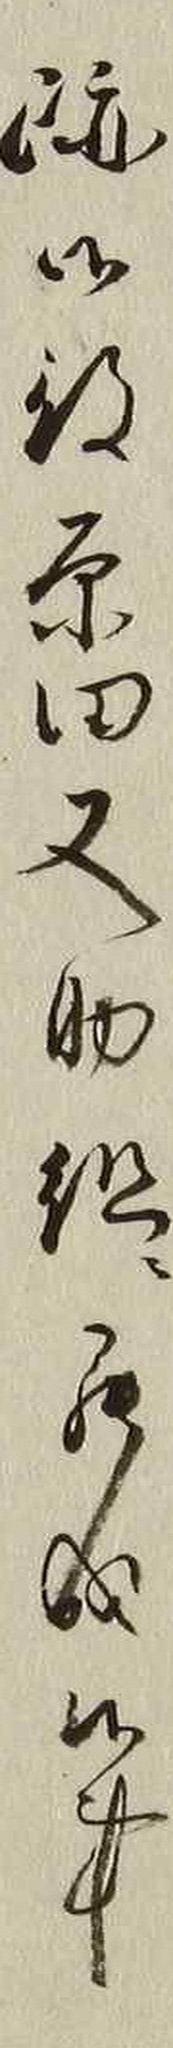跡御役原田又助組ニ罷成候事
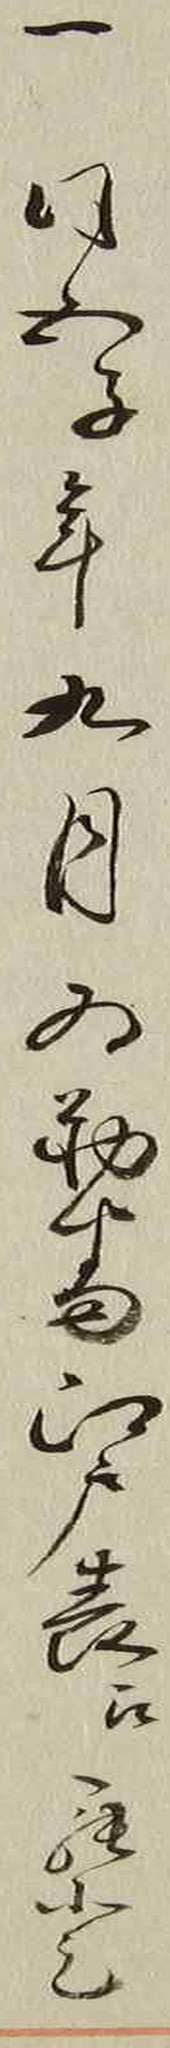一同五子年九月為勤番江戸表江罷登
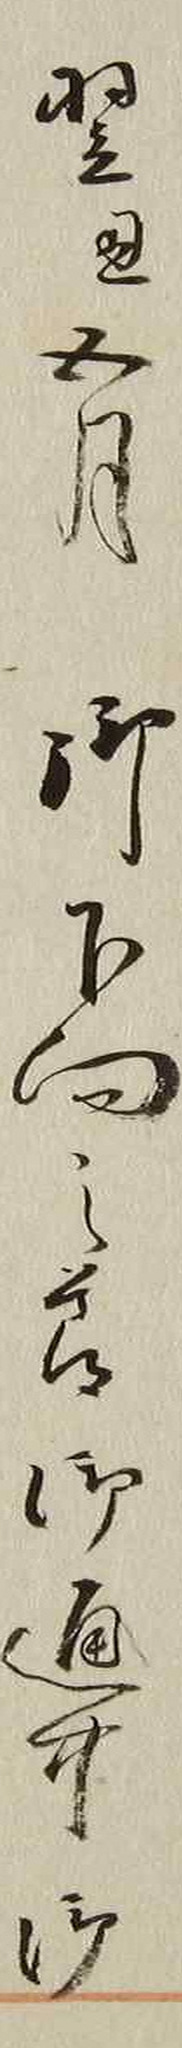翌丑五月御下向之節御通中御
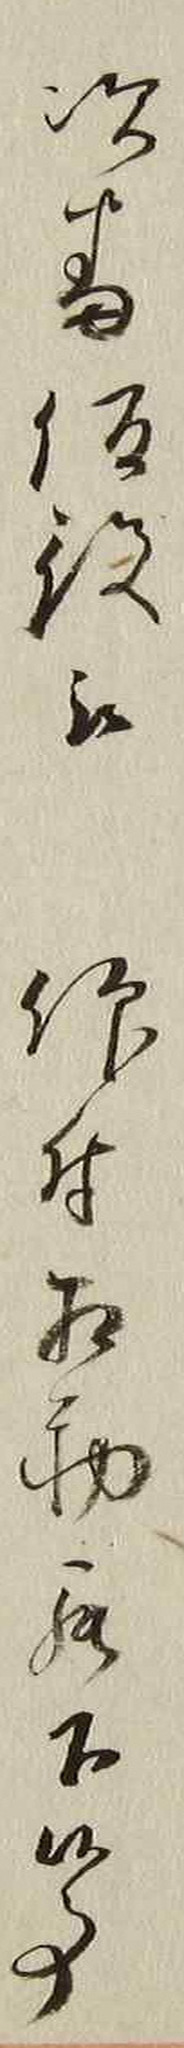次番仮役被仰付相勤罷下候事
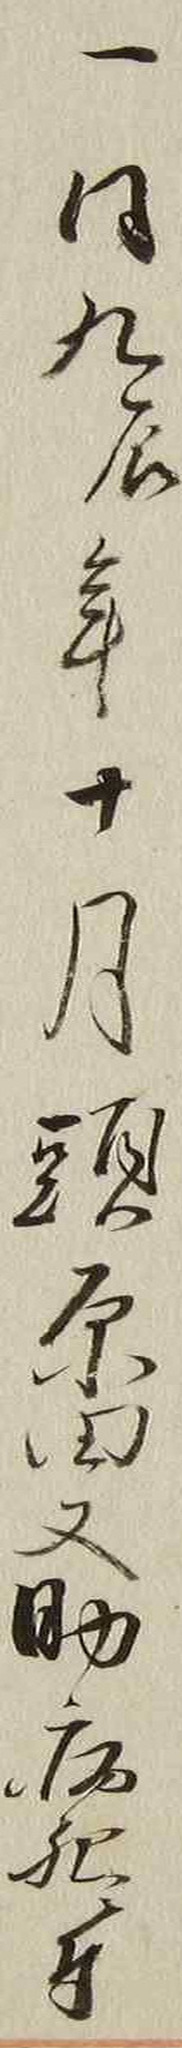一同九辰年十月頭原田又助病死ニ付
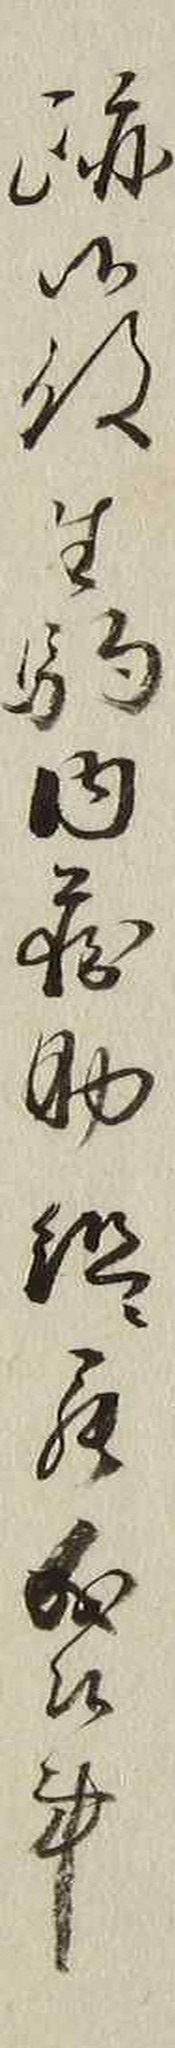跡御役生駒内蔵助組ニ罷成候事
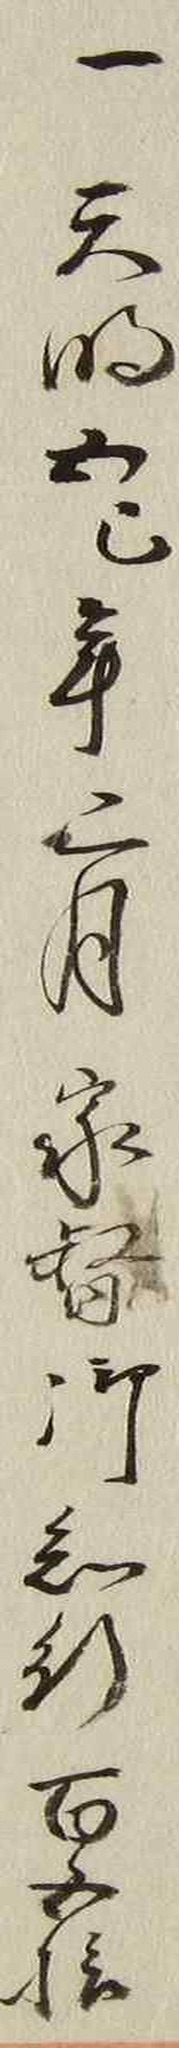一天明五巳年二月家督御知行百五拾
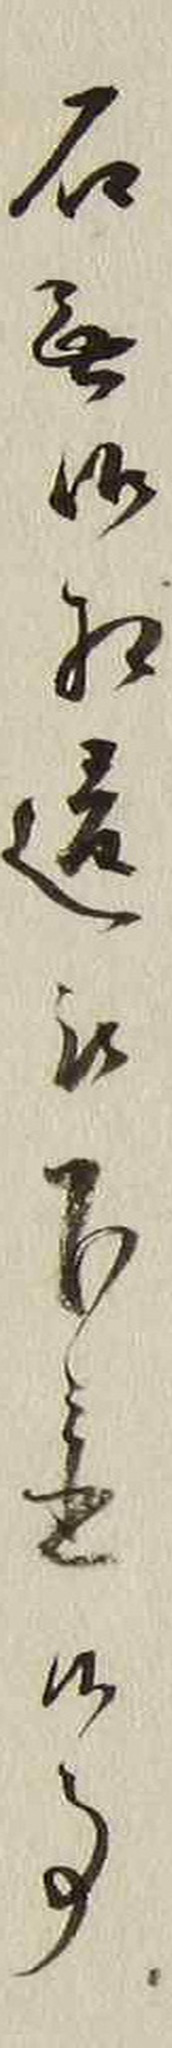石無御相違被下置候事
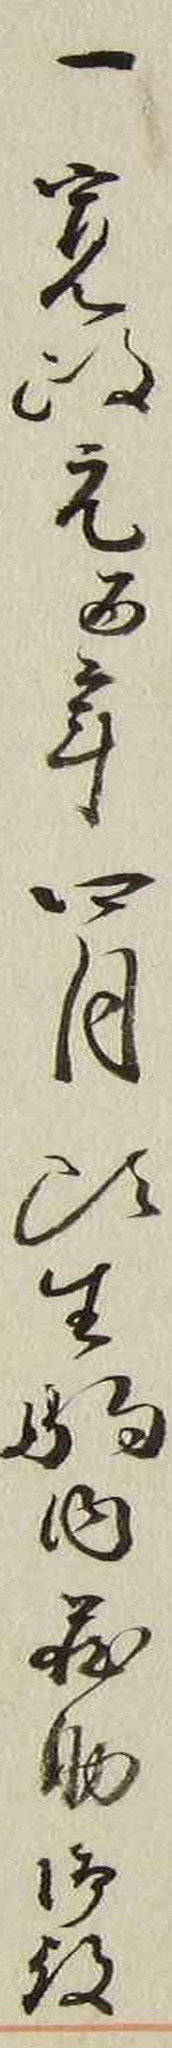一寛政元酉年四月頭生駒内蔵助御役
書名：諸士系譜　巻之141　た之部17
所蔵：会津若松市立会津図書館
